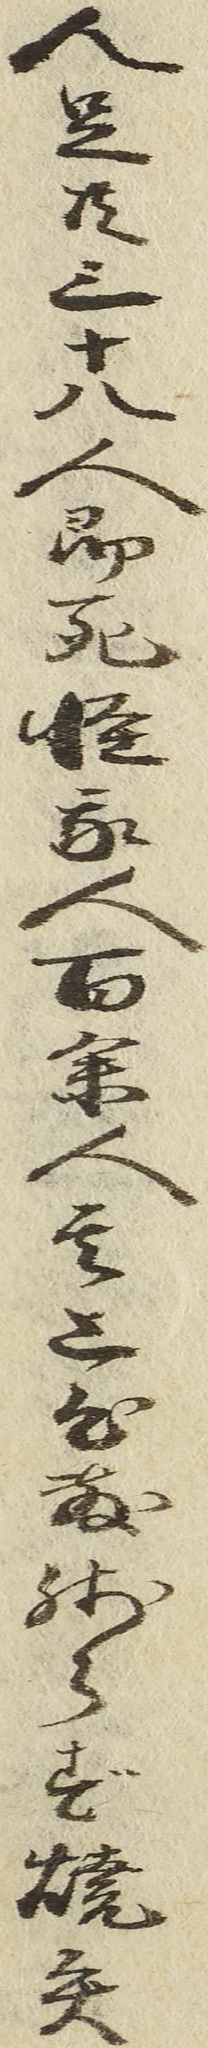人足共三十八人即死怪我人百余人其上屋敷残らず焼失

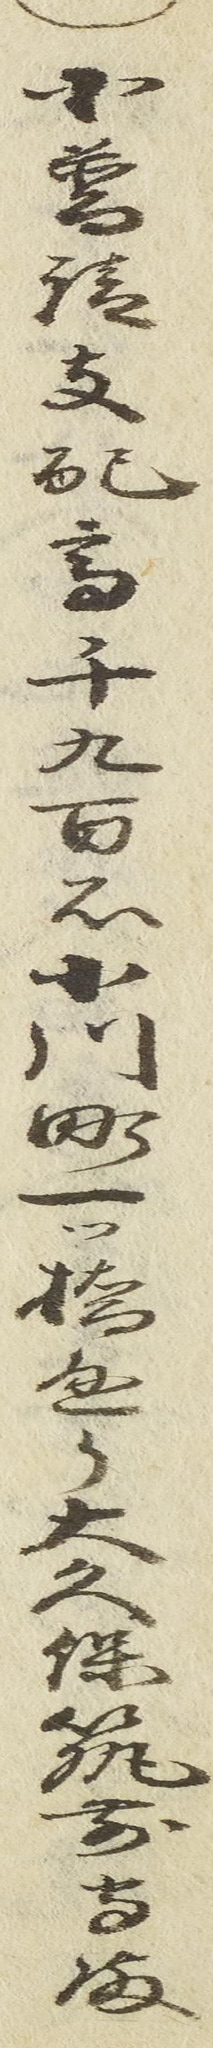○小普請支配高千九百石小川町一ツ橋通り大久保筑前守殿
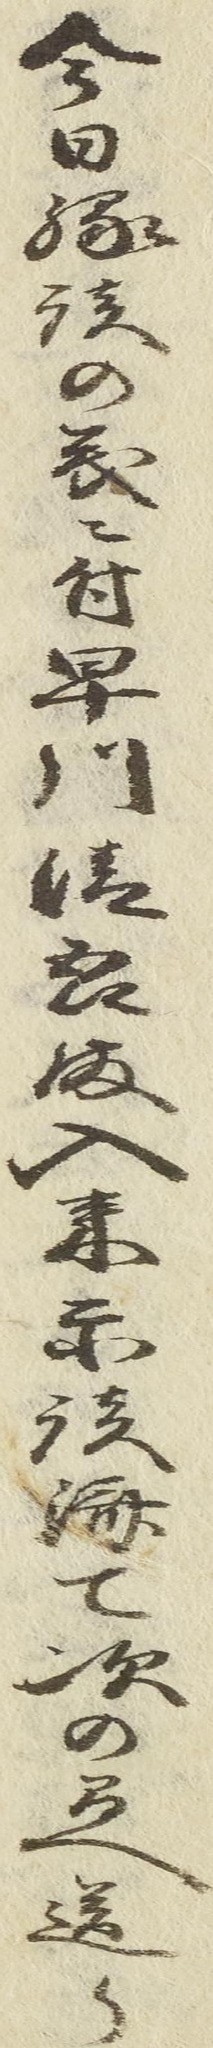今日縁談の義ニ付早川清吾殿入来示談済て次の間へ送り
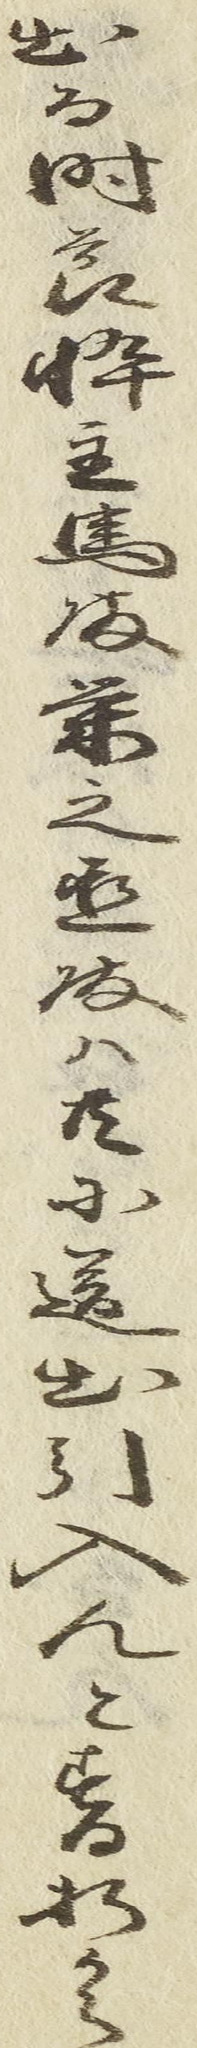出る時節悴主馬殿栄之丞殿は共に送出引入んとする折から
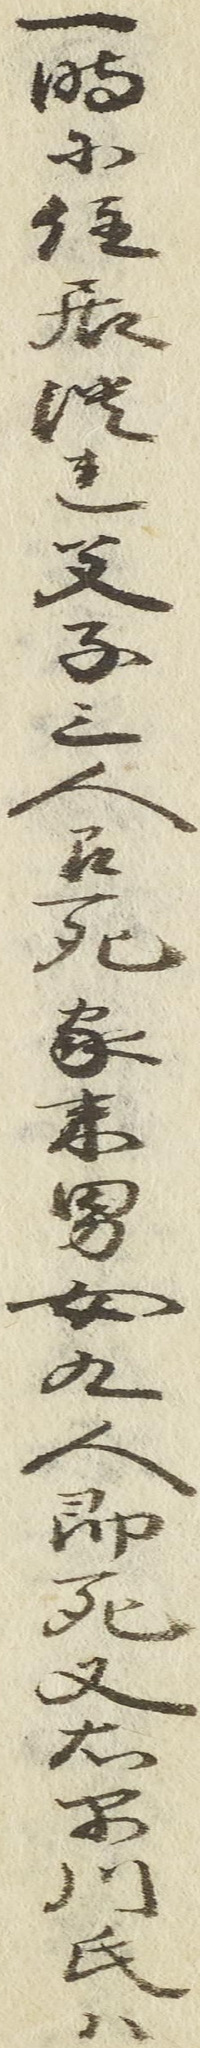一時に住居潰れ父子三人即死家来男女九人即死又右早川氏は
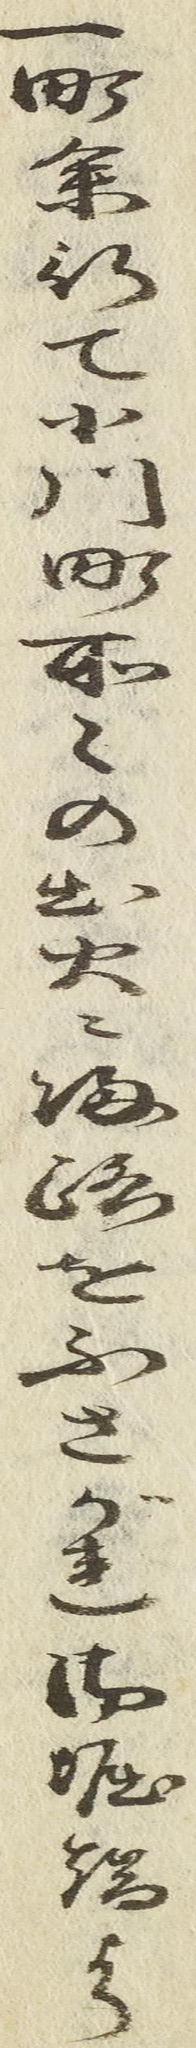一町余行て小川町所々の出火ニ帰路をふさがれ御堀端より
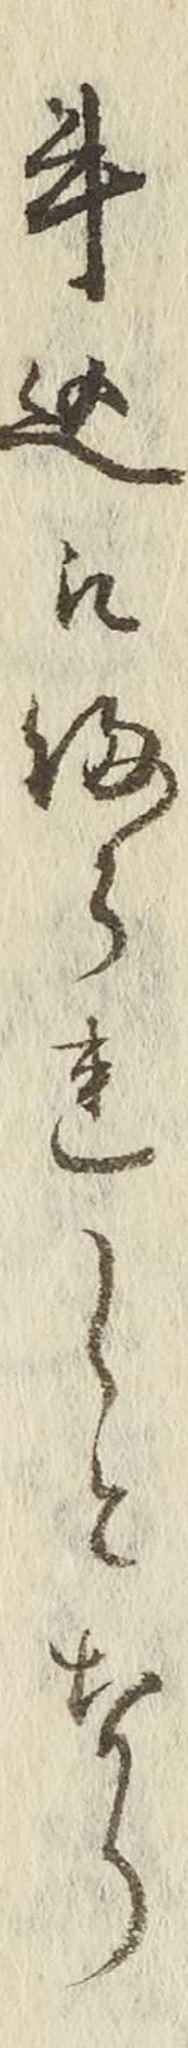牛込江帰られしとなり
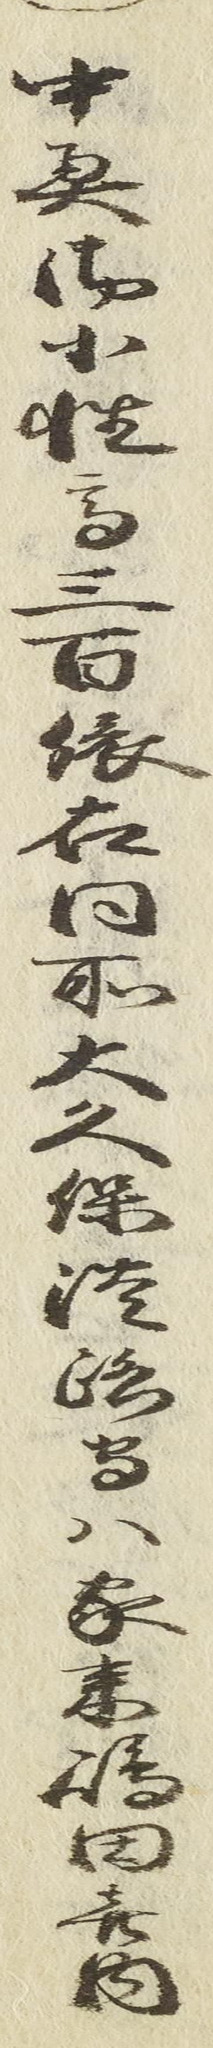○中奥御小性高三百俵右同所大久保淡路守は家来嶋田喜内
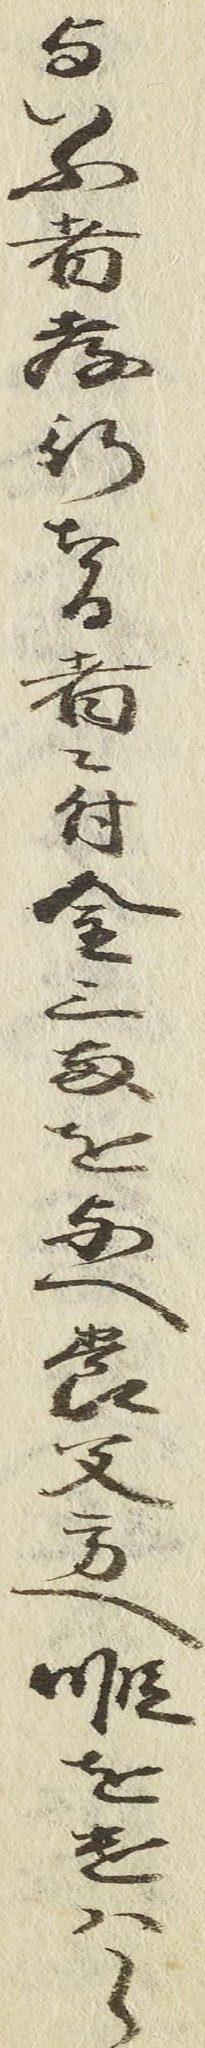与いふ者孝行なる者ニ付金三両を与え養父方へ暇を遣はし
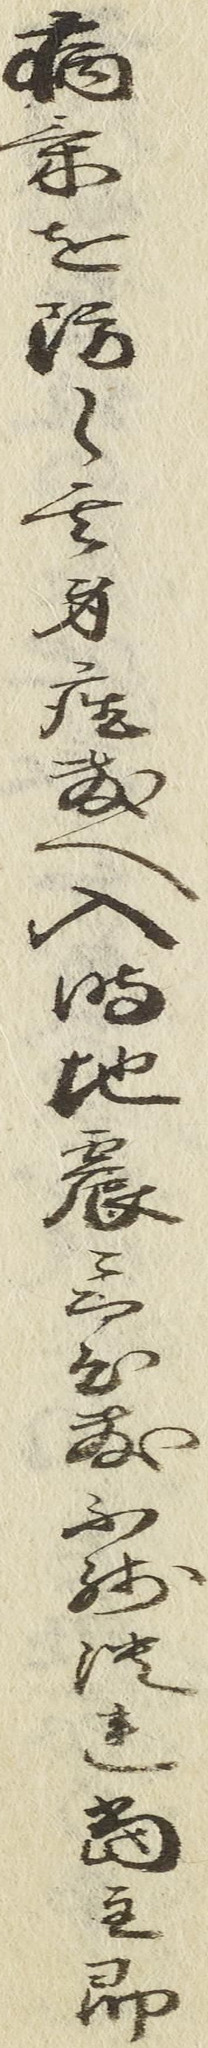病気を防し其身座敷へ入時地震ニ而屋敷不残潰れ当主即
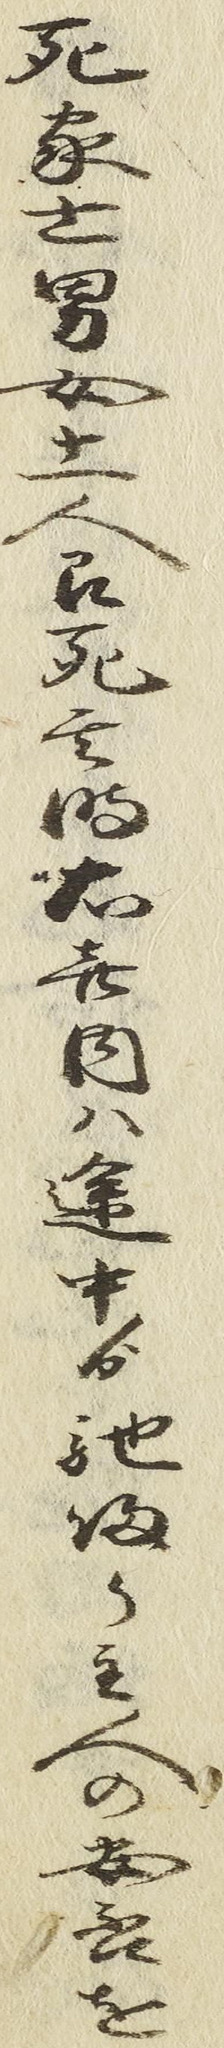死家士男女十一人即死其時右喜内は途中ゟ馳帰り主人の安否を
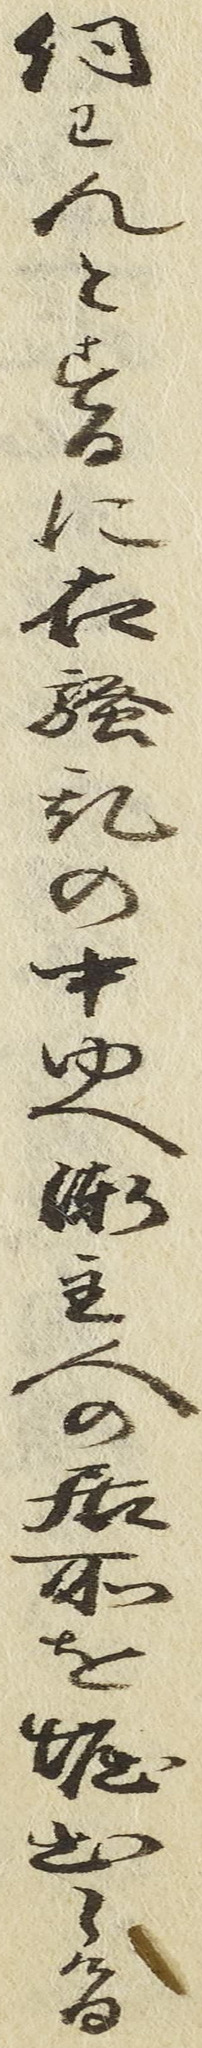伺わんとするに右騒乱の中ゆへ漸主人の居所を掘出しける
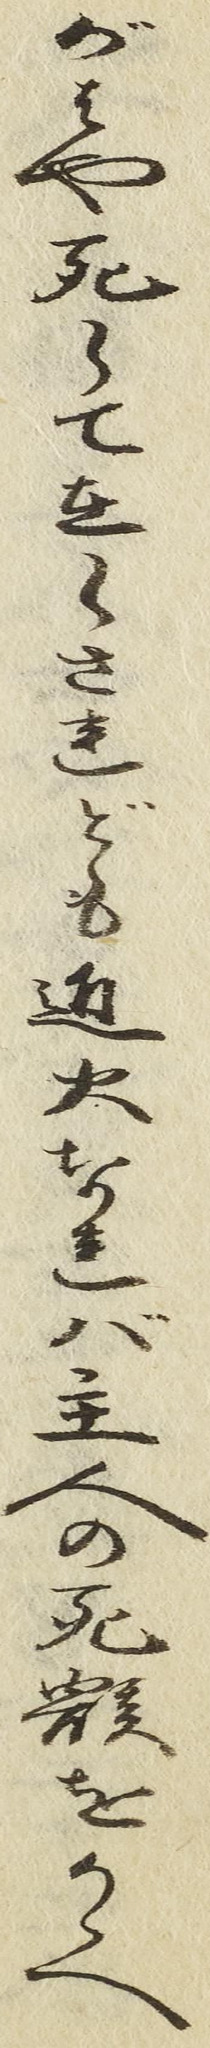がはや死して在しされども近火なれば主人の死骸をかゝへ
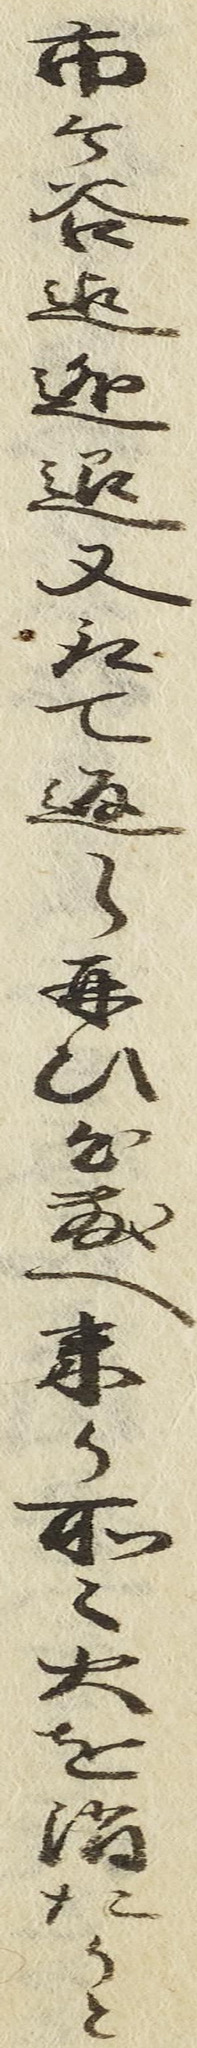市ヶ谷迄逃退又取て返し再ひ屋敷へ来り所々火を消たりと
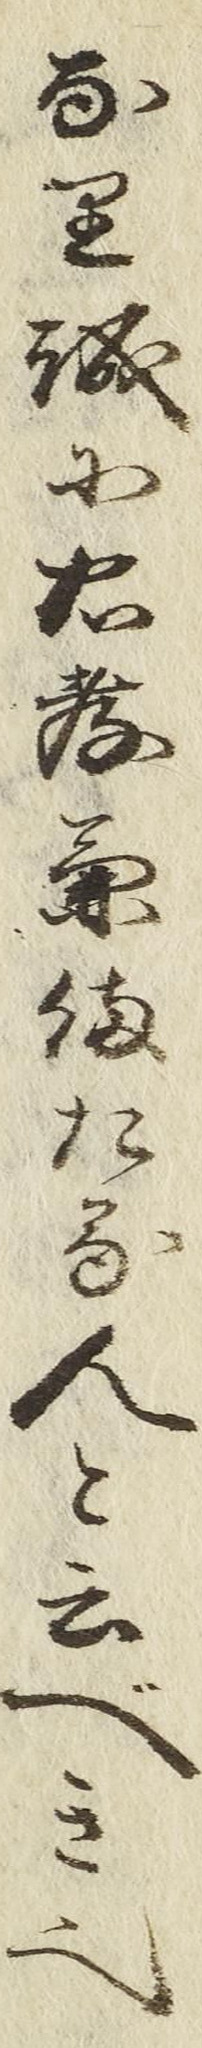なり誠に忠孝兼備たる人と云べき也
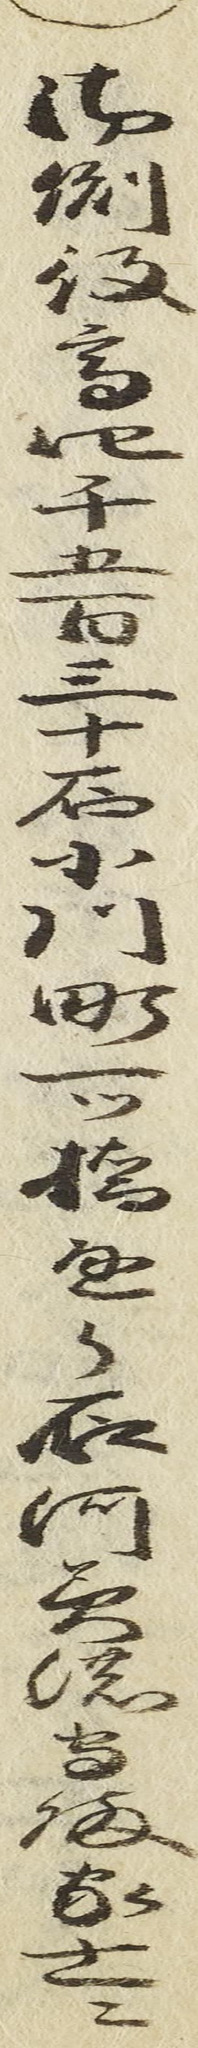○御側役高四千五百三十石小川町一ツ橋通り石川美濃守殿家士ニ
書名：安政二年震災記事　完
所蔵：東京大学地震研究所図書室 Earthquake Research Institute Library, The University of Tokyo, JAPAN
